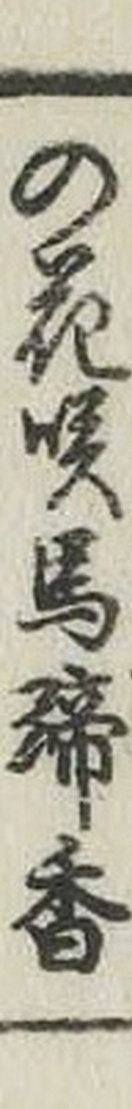の花咲馬蹄香
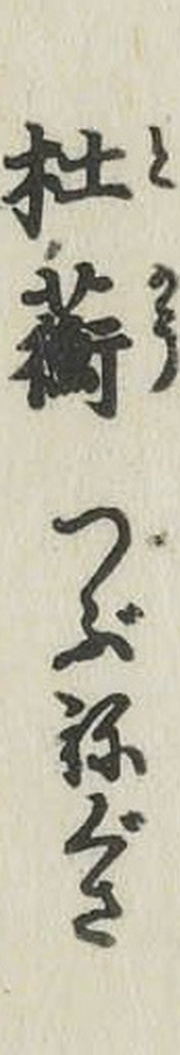杜蘅つぶねぐさ
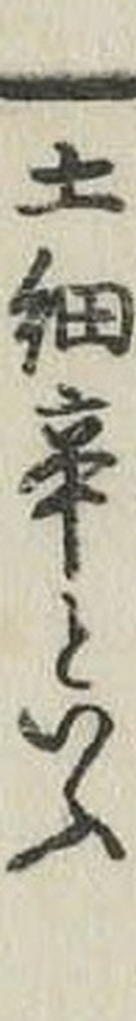土細辛といふ

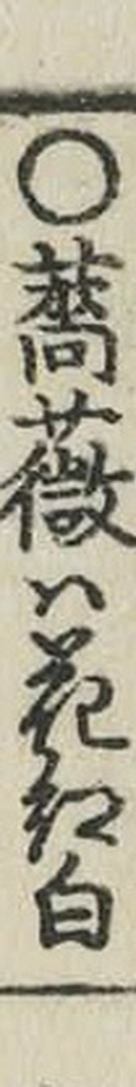○薔薇は花紅白
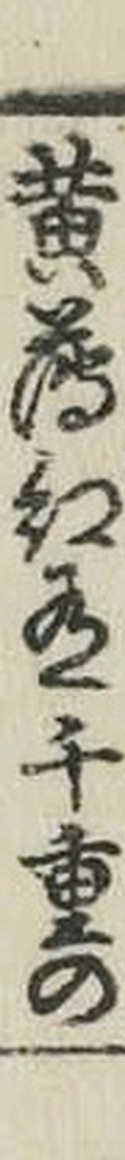黄薄紅有千重の
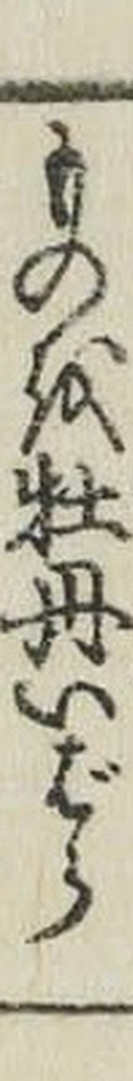ものを牡丹いばら
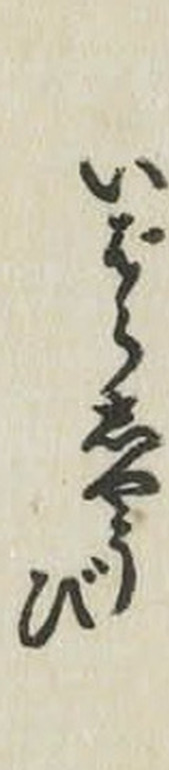いばらしやうび
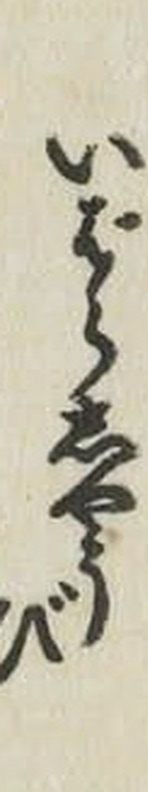いばらしやうび
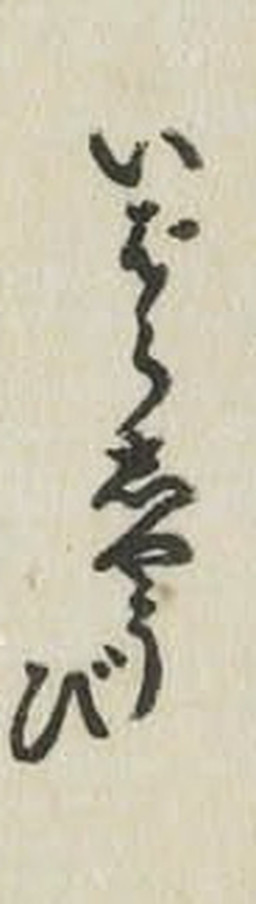いばらしやうび
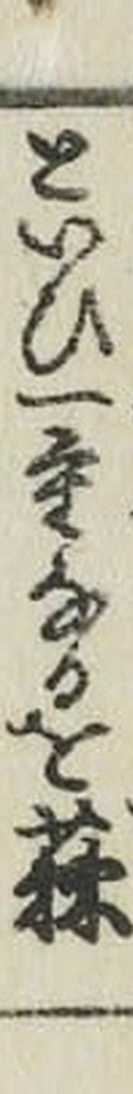といひ一重なるを蕀
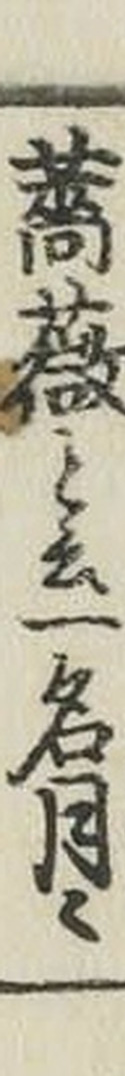薔薇と云一名月々
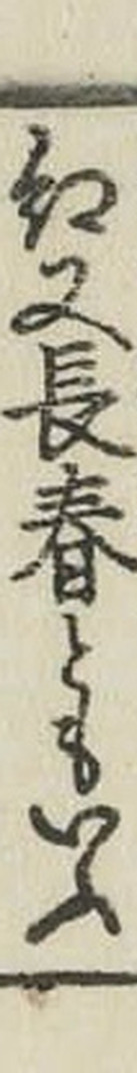紅又長春ともいふ
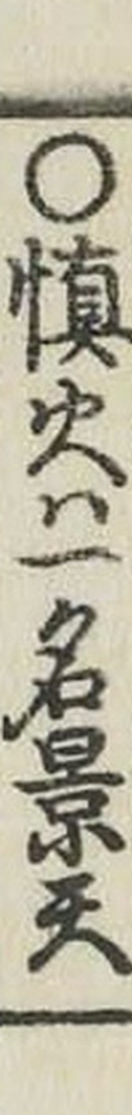○慎火は一名景天
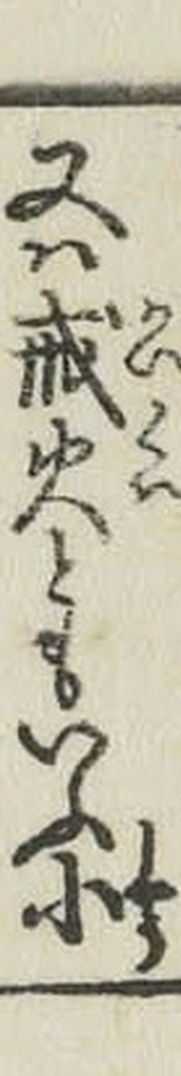又は戒火ともいふ小
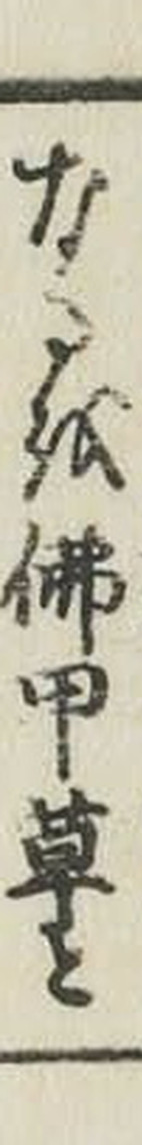なるを仏甲草と
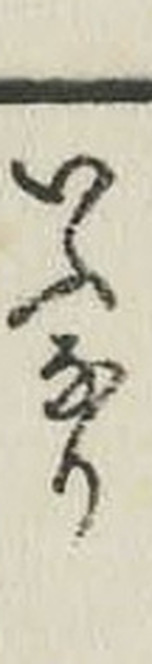いふなり
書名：増補頭書訓蒙図彙大成 10巻 9:巻之20
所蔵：東京学芸大学教育コンテンツアーカイブ
